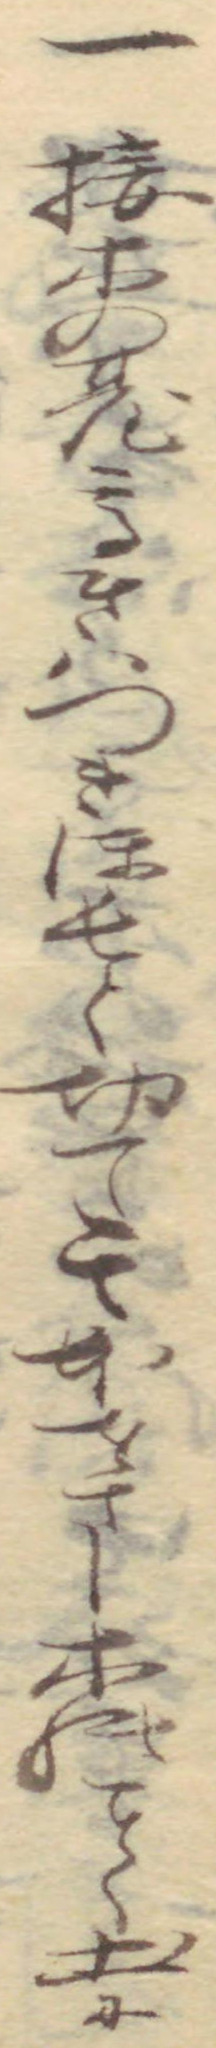一接木の臺高きハつきほ長く切て其本をさし木のことく土に
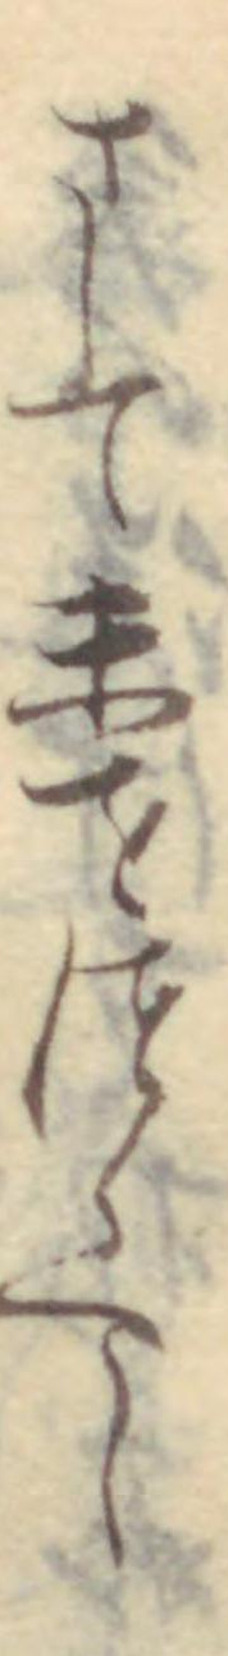さして末をつくへし
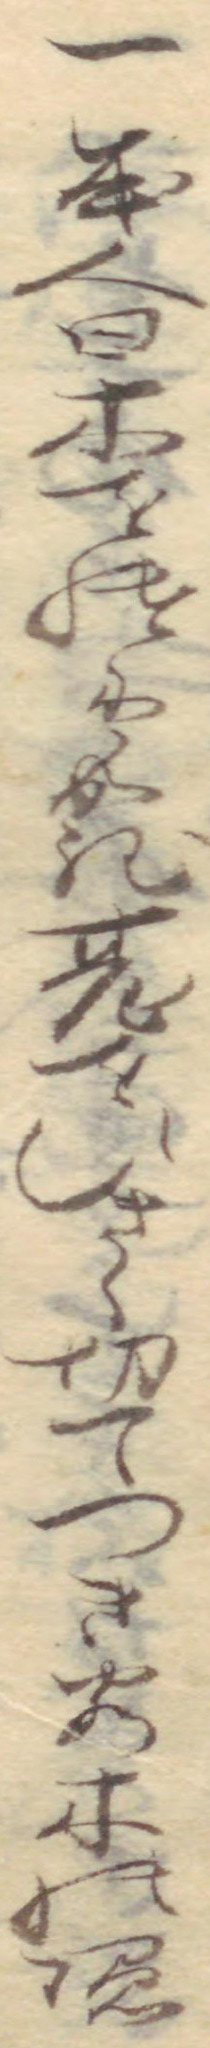一或人曰木を継に成程臺をひきく切てつき客木の隠
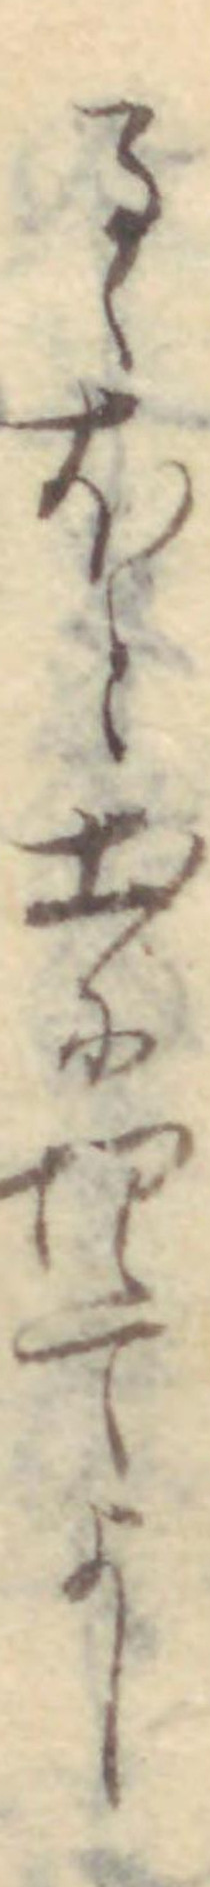るゝほと土に埋てよし
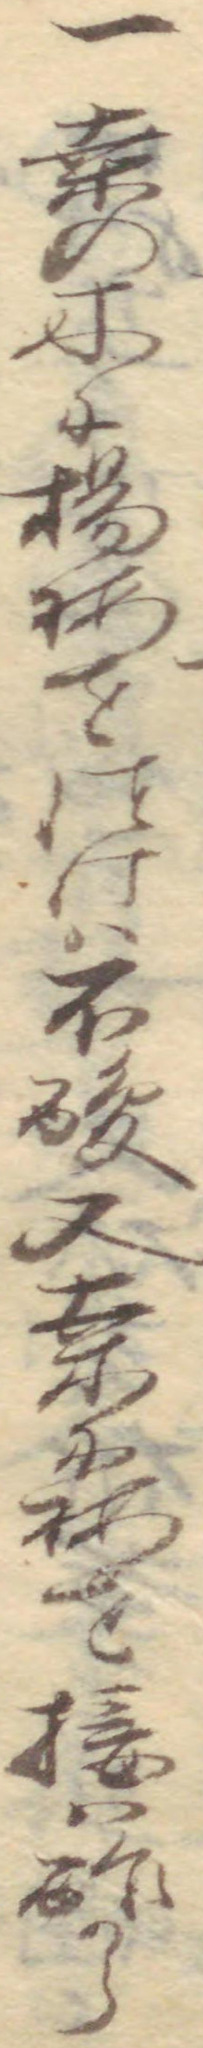一桑の木に揚梅をつけハ不酸又桑に梅を接は酢から
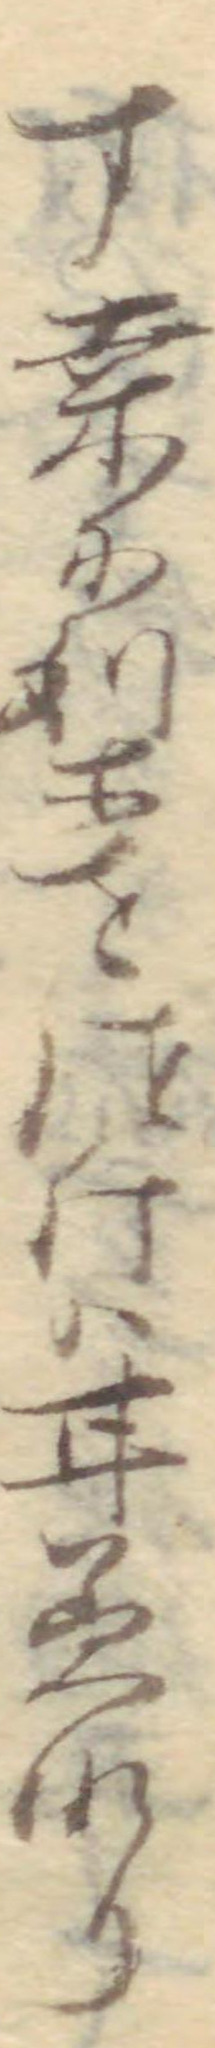すくわに梨をつけハ甘美なり
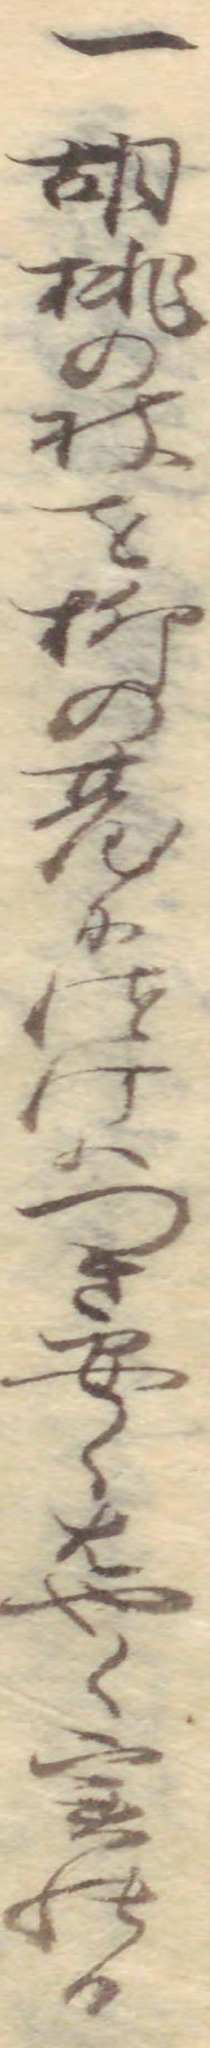一胡桃͡の枝を楊の臺につけハつき安くはやく実のる
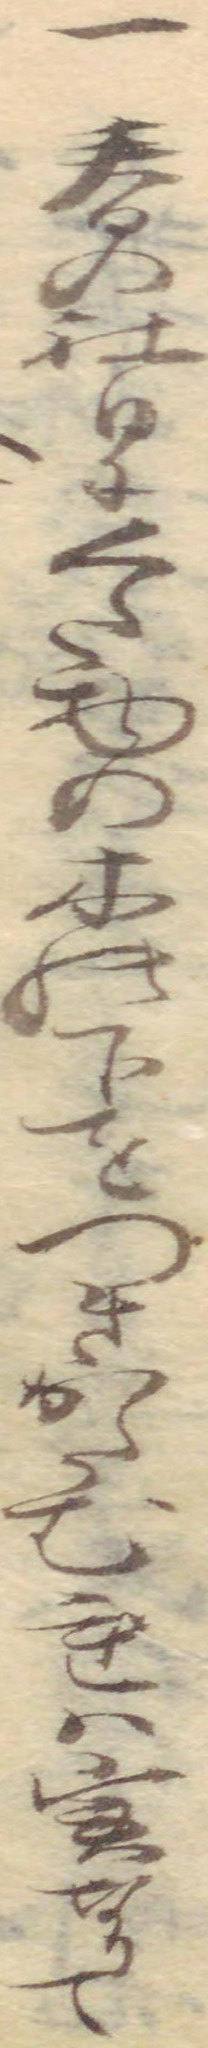春の社日にくた物の木の下をつきかたむれハ実なりて
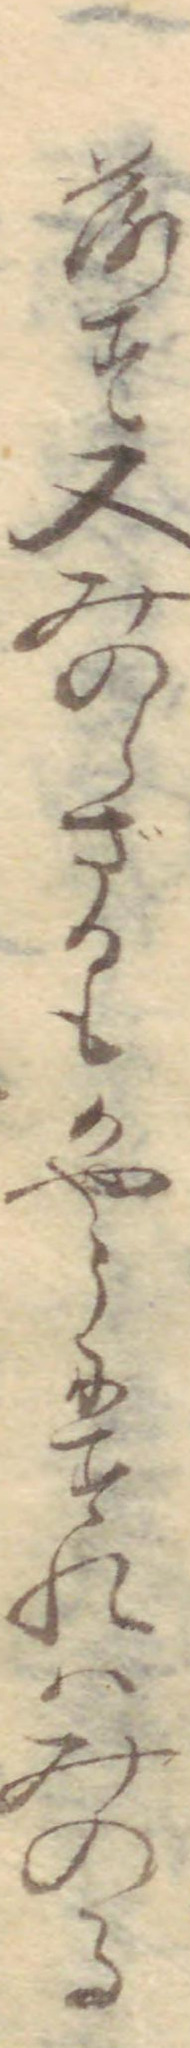落す又みのらざるもかやうにすれハみのる
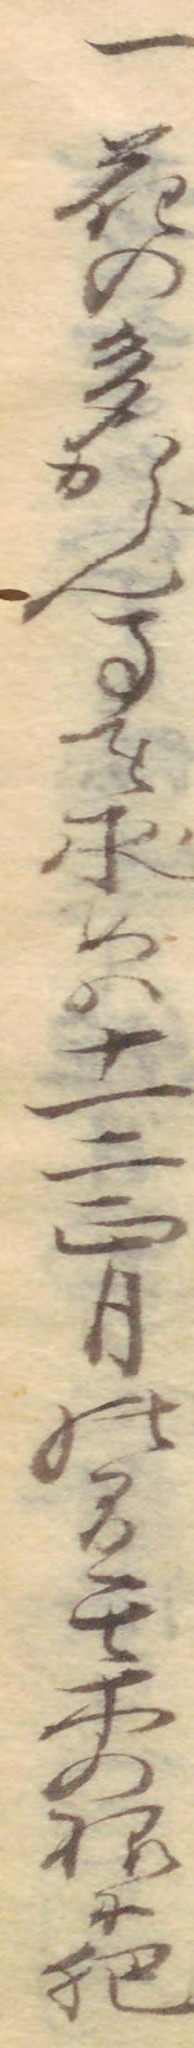一花の多からんことを求めは十一二正月の間そのきのねに肥

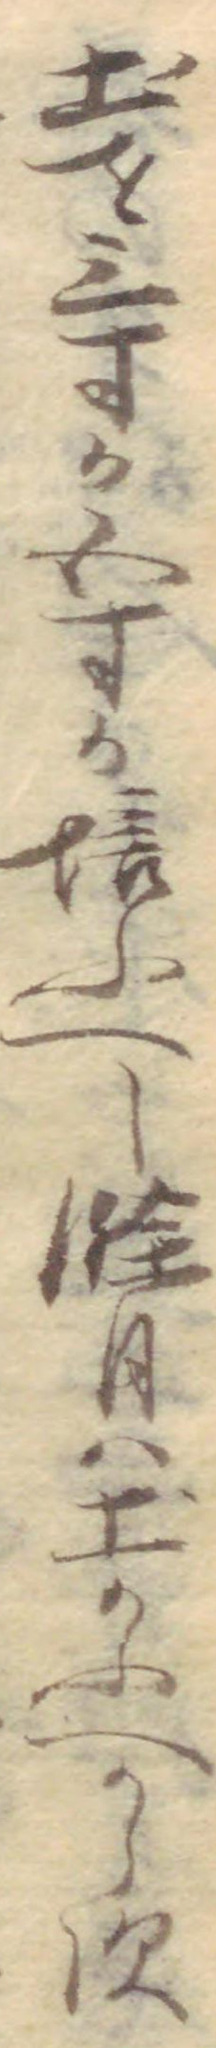土を三寸か五寸か培ふへし睦月ハ土かふへからす
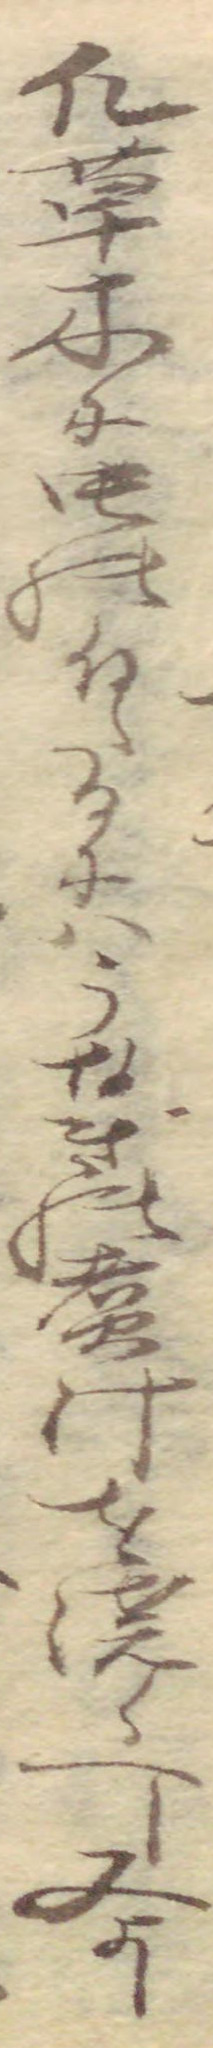一凡そ草木に虫の付たるにハうなぎの煮汁を澆くへし又よし
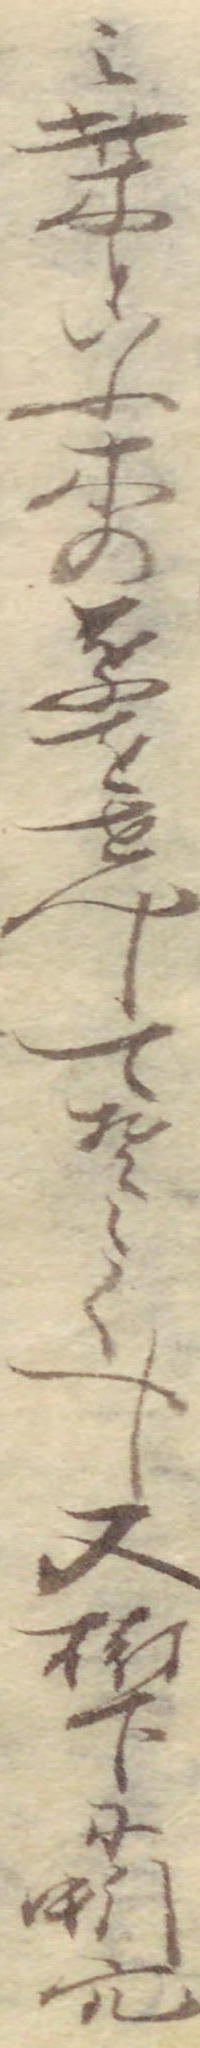ミ桑といふ木の葉をせんしてそゝくへし又黄樹下に蚓穴
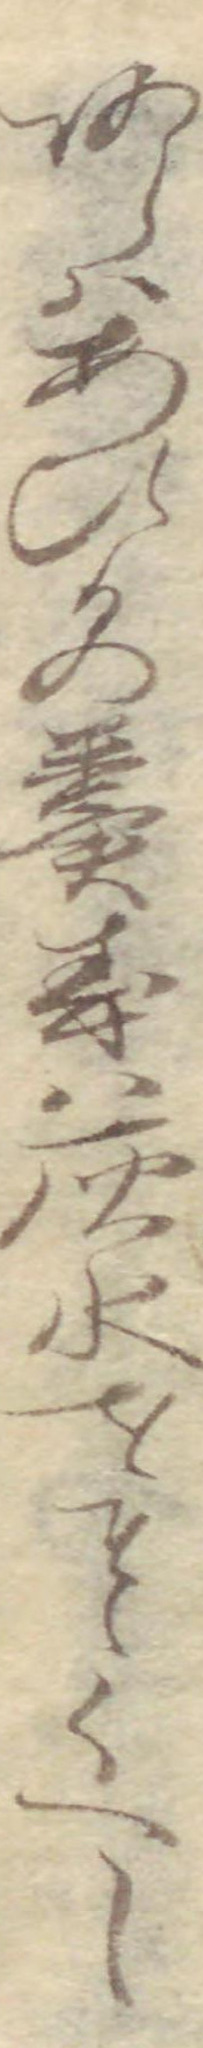あらハあひるの糞或ハ灰水をそゝくへし
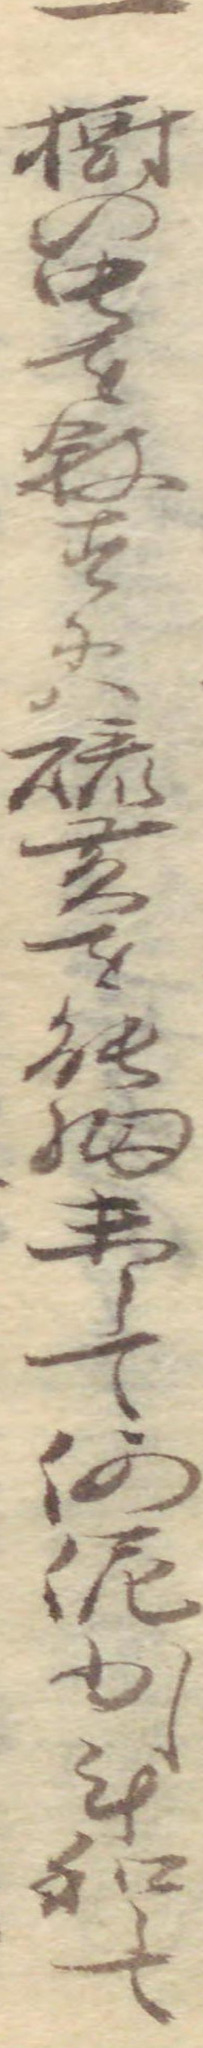一樹の虫を殺すには硫黄を能細末して河泥少し斗和して
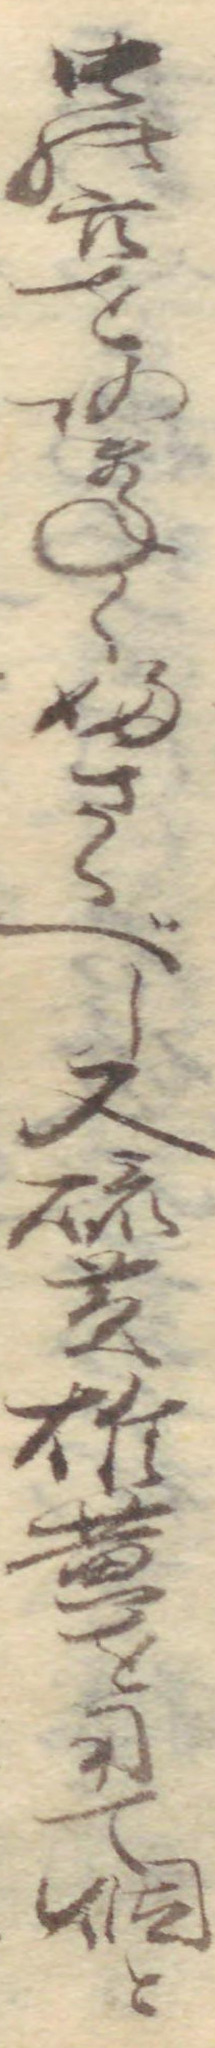虫の穴をあまねくふさくべし又硫黄雄黄を用て烟と
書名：鶯宿雑記. 巻199-200
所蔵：国立国会図書館 National Diet Library, JAPAN
